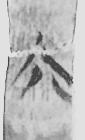六
